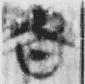各
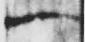一
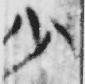少
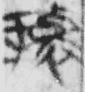環
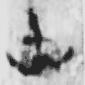山
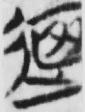迻
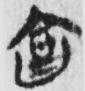會
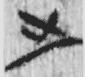之
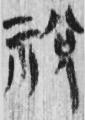敓
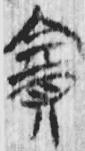賽
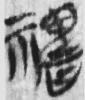禱
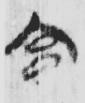宮
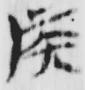矦（后）
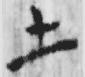土
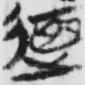迻
